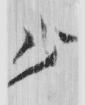少
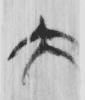大
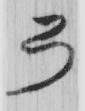乃
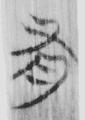有
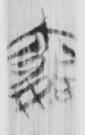{尒䎽}
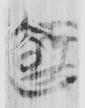智
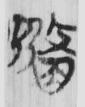{弼攴}
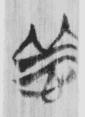恙
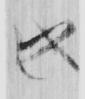女
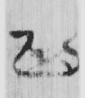𠀠
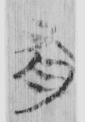有
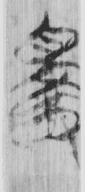{目幸廾}
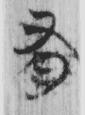有
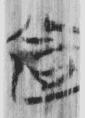甚
